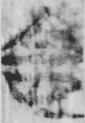{宀𠁩}
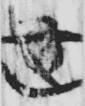正
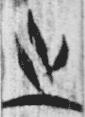之
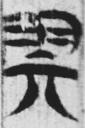○（旗）
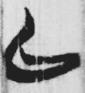㠯（以）
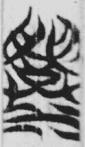○（熊）
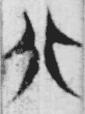北
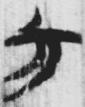方
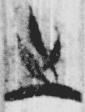之
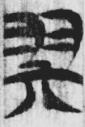○（旗）
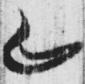㠯（以）
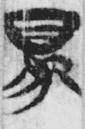鳥
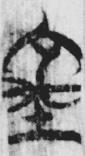○（禹）
